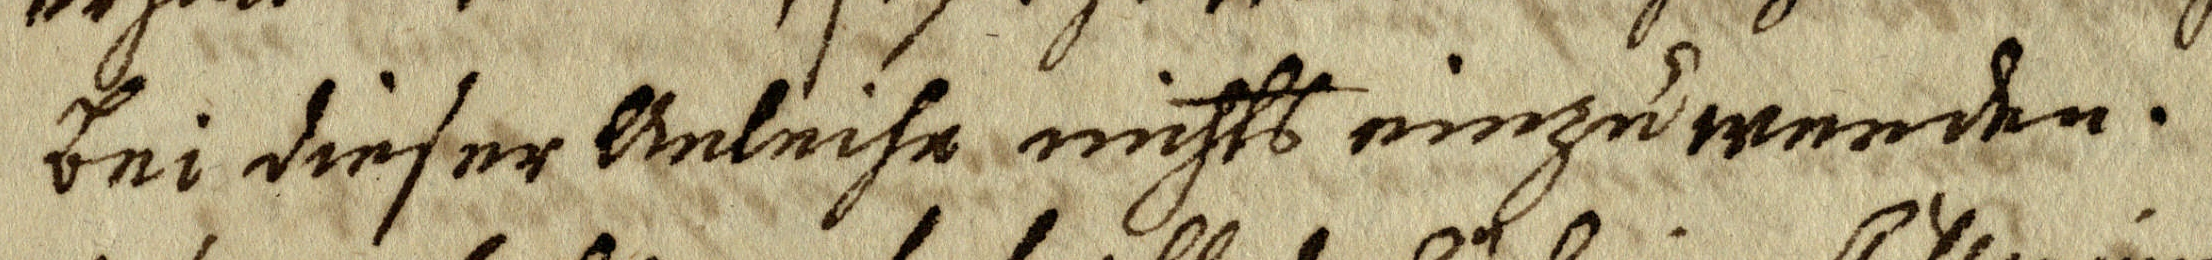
bei dieser Anleihe nichts einzuwenden.
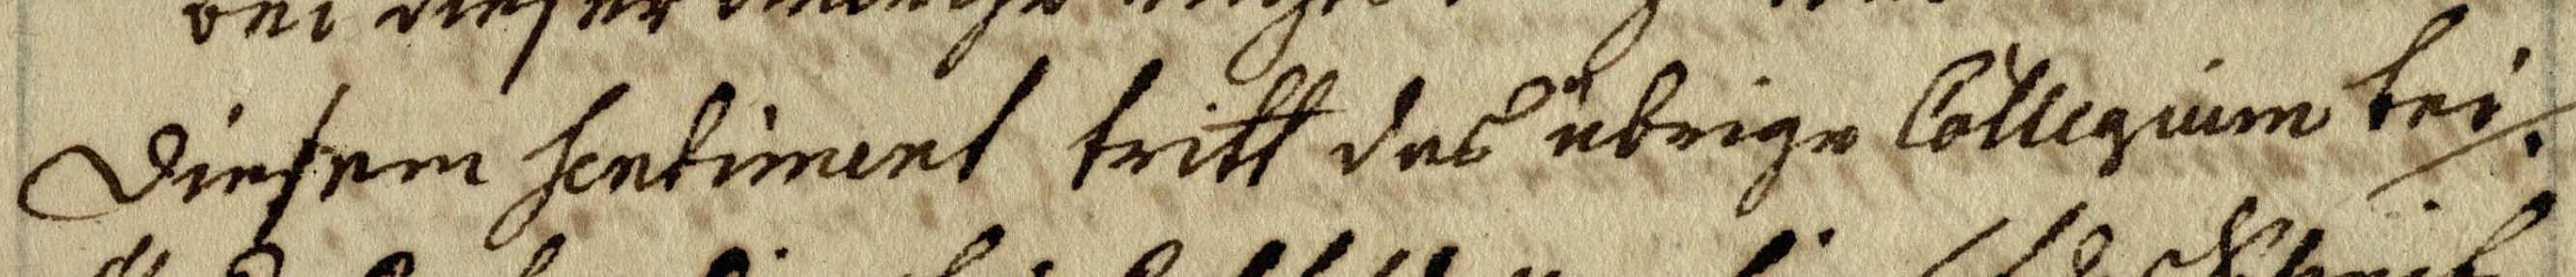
Diesem sentiment tritt das übrige Collegium bei.
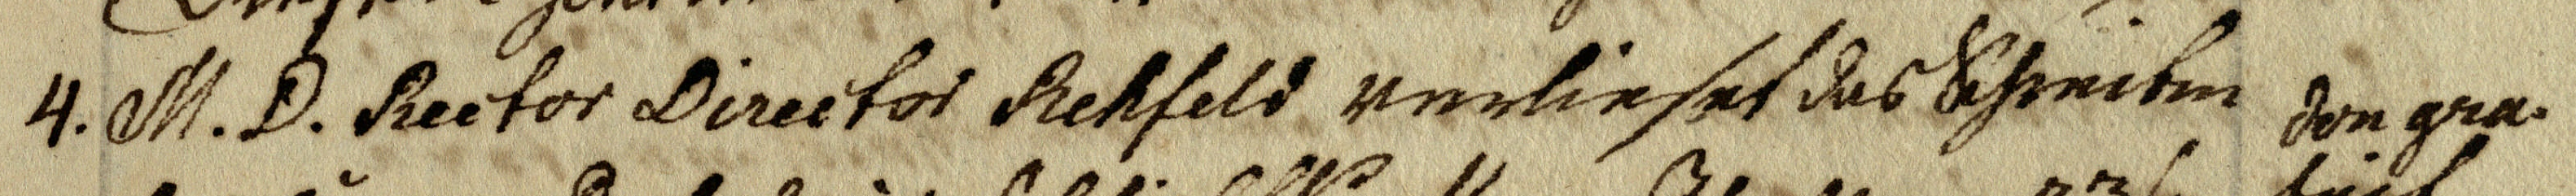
4. M. D. Rector Direktor Rehfeld verlieset das Schreiben
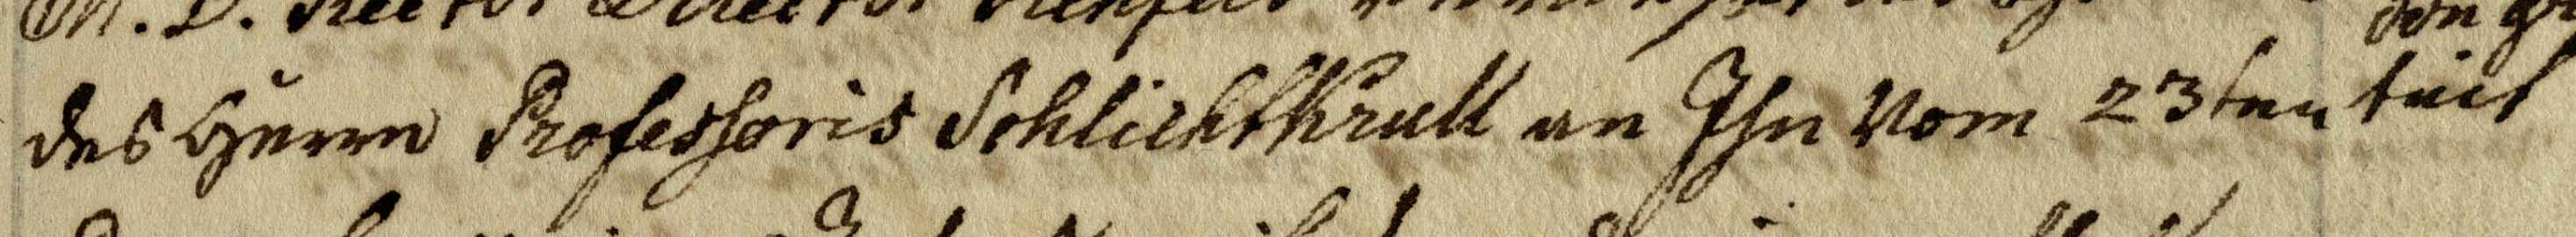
des Herrn Professoris Schlichtkrull an Ihn vom 23 ten
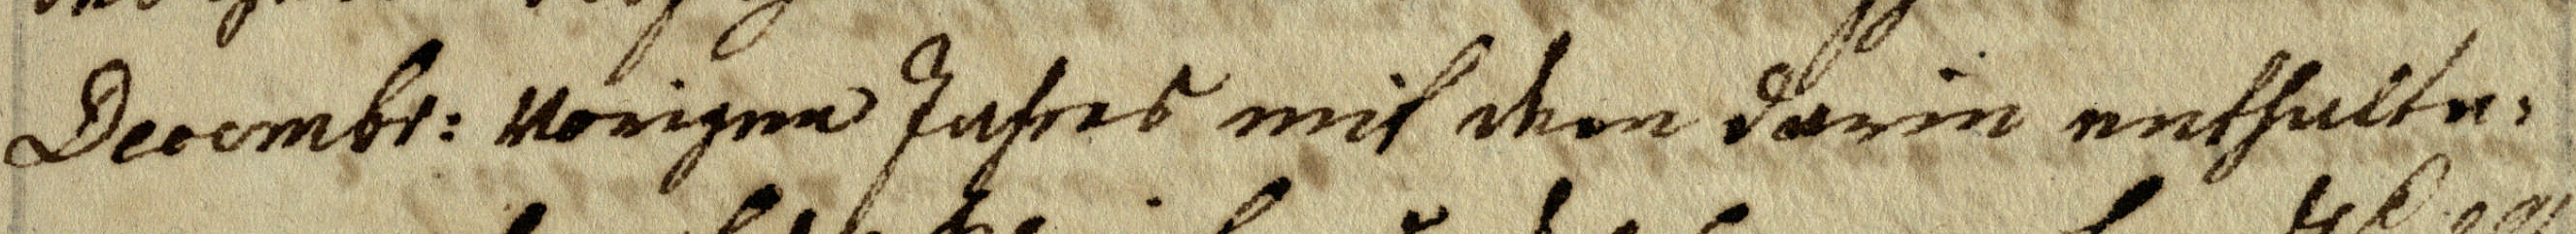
Decembr. vorigen Jahres mit dem darin enthalte¬
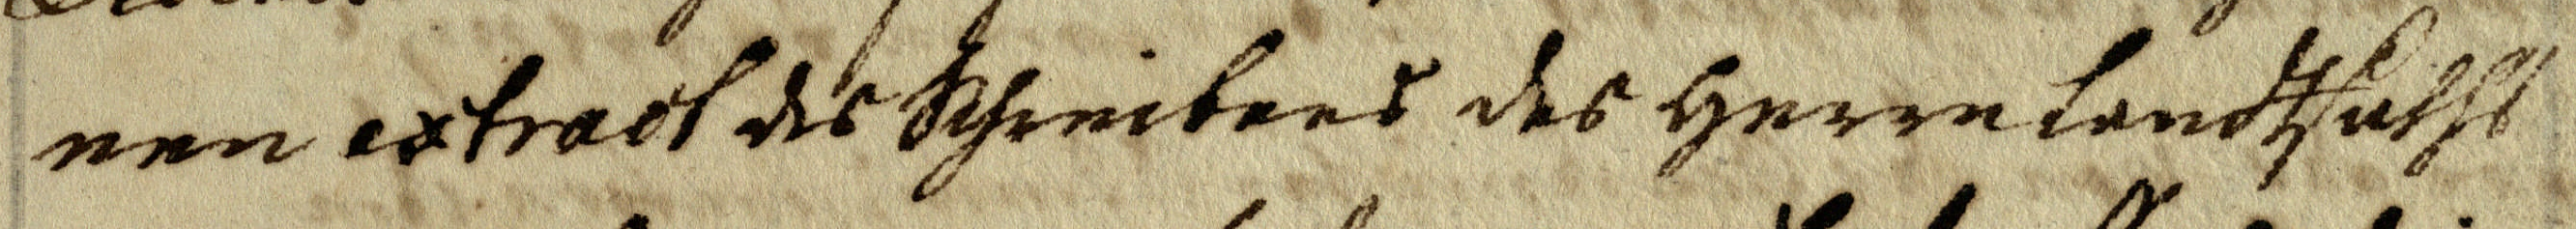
nen extract des Schreibens des Herrn LandRaths
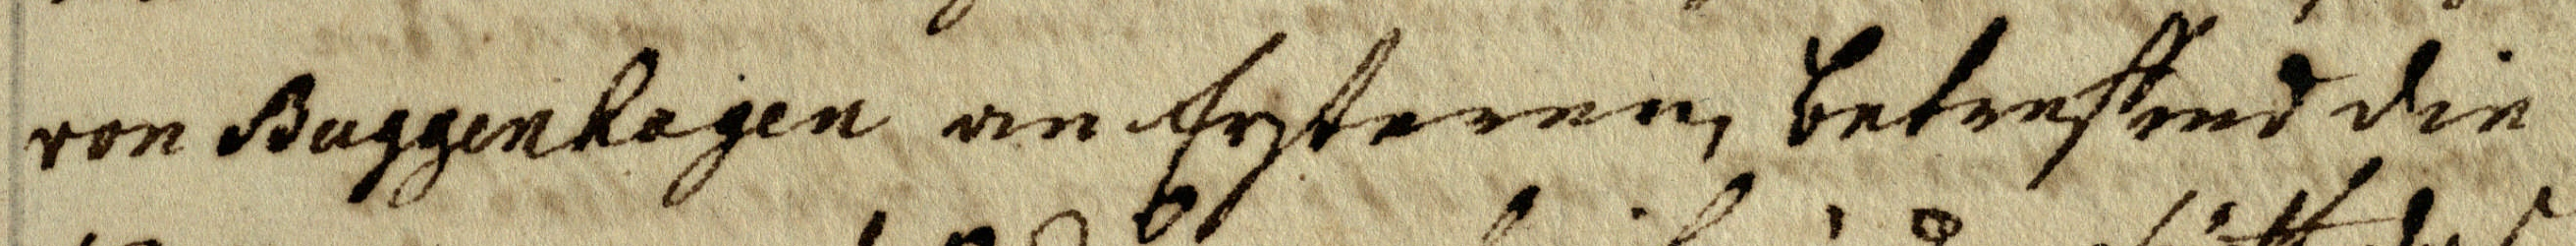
von Buggenhagen an Ersteren, betreffend die
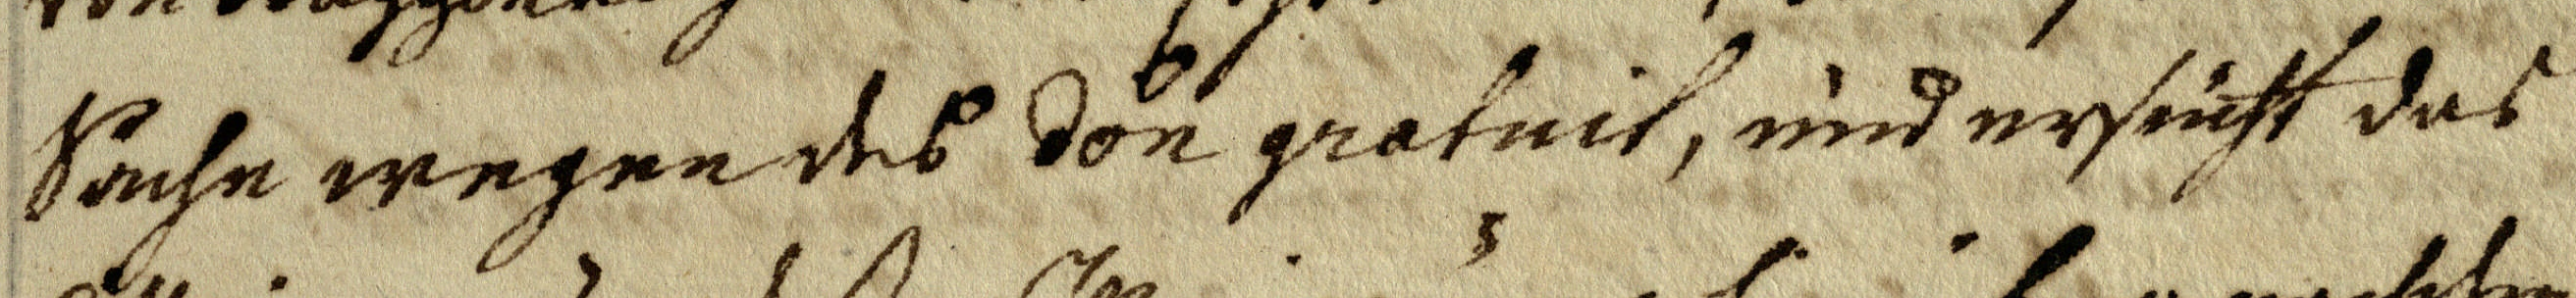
Sache wegen des don gratuit, und ersucht das
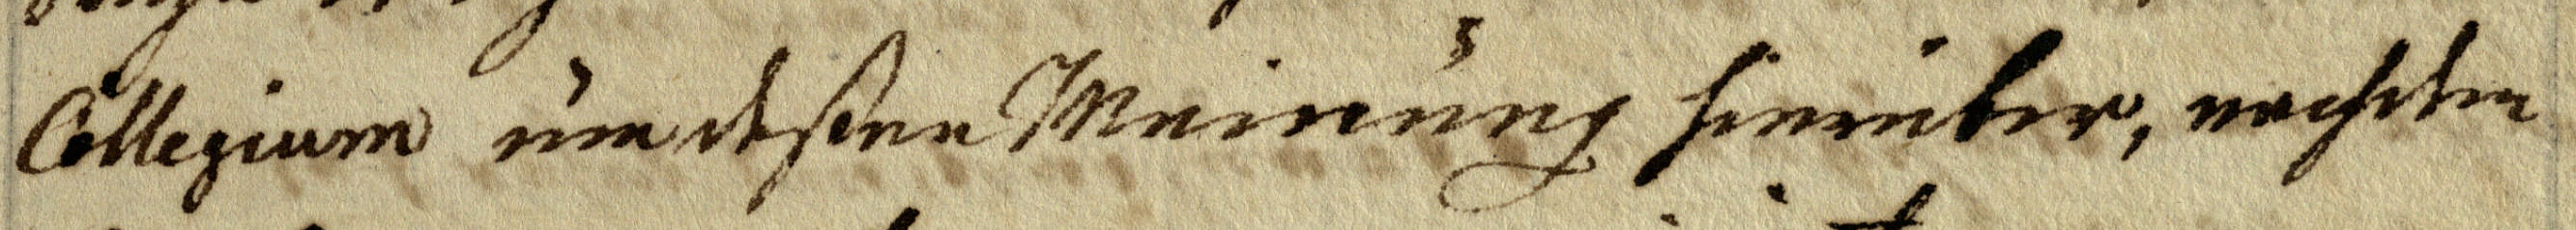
Collegium um dessen Meinung hierüber, nachdem
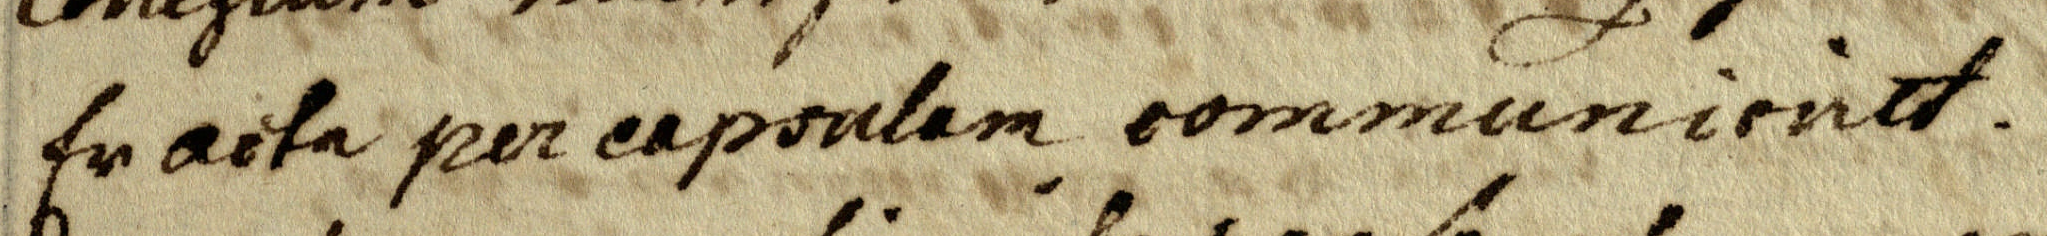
Er acta per capsulam communiciret.
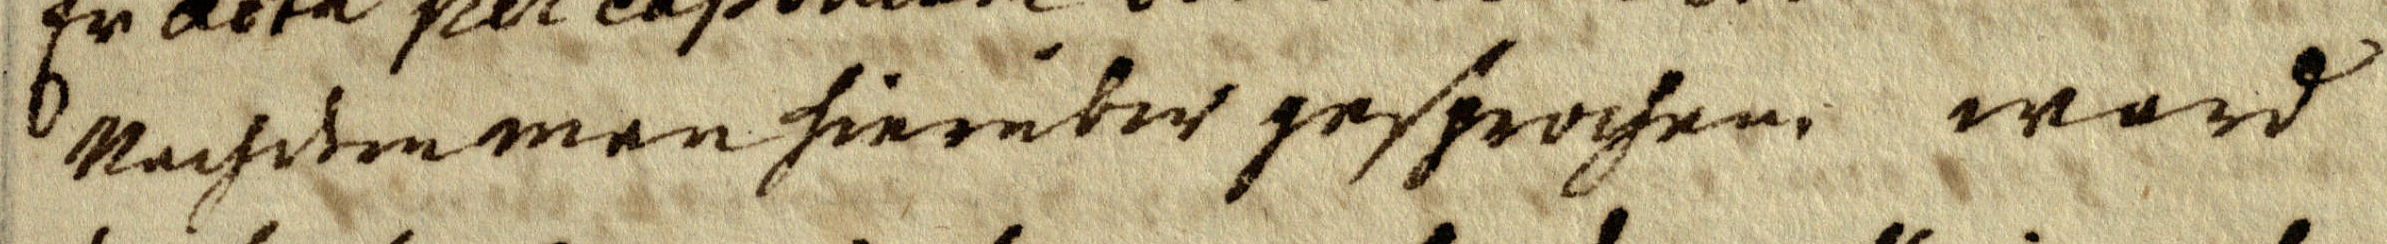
Nachdem man hierüber gesprochen, ward
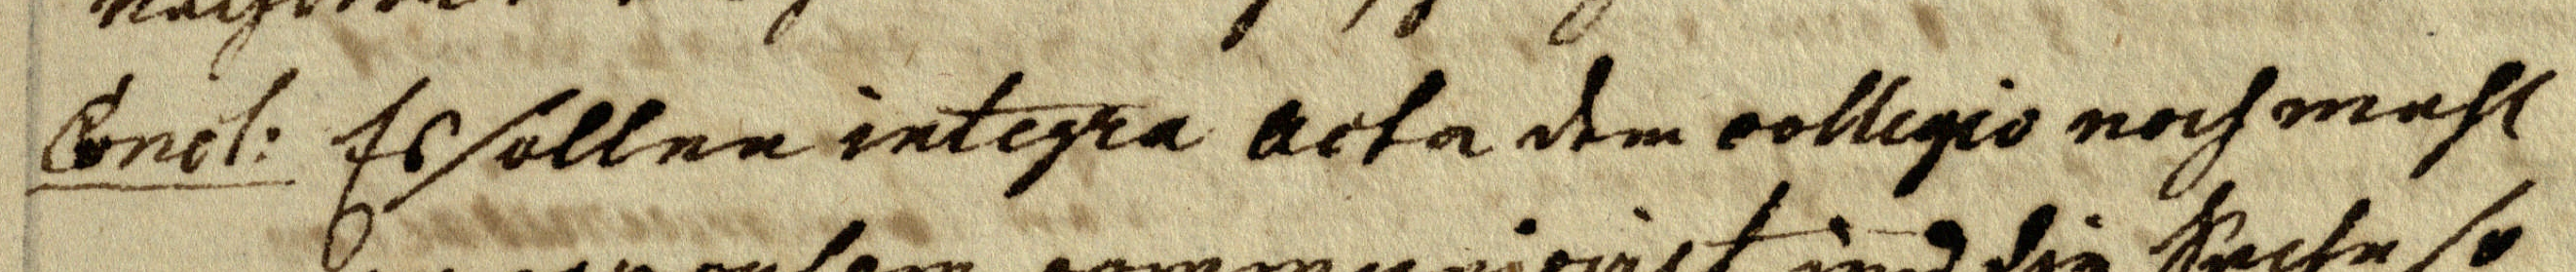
Concl. Es sollen integra acta dem collegio nochmahl
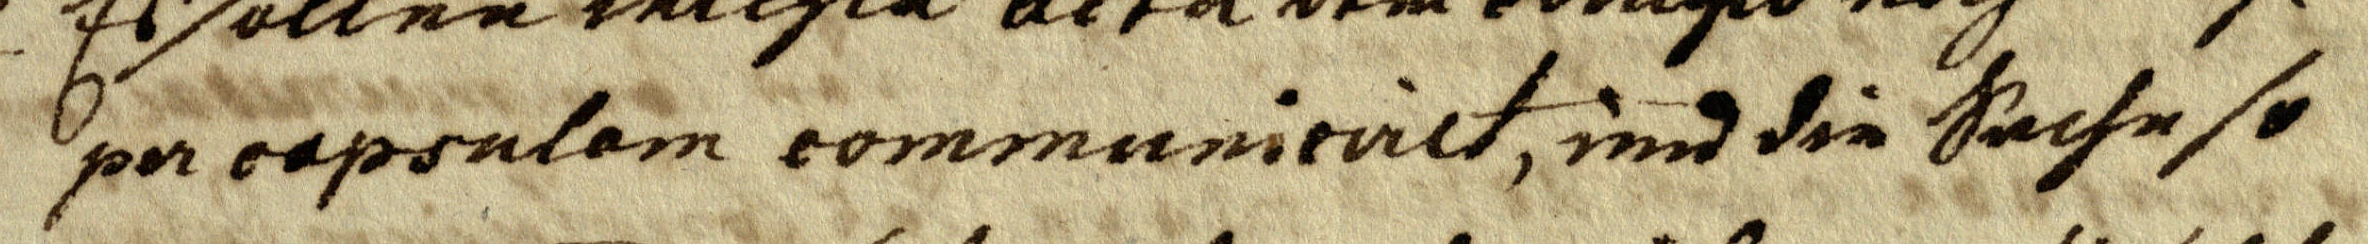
per capsulam communiciret, und die Sache so
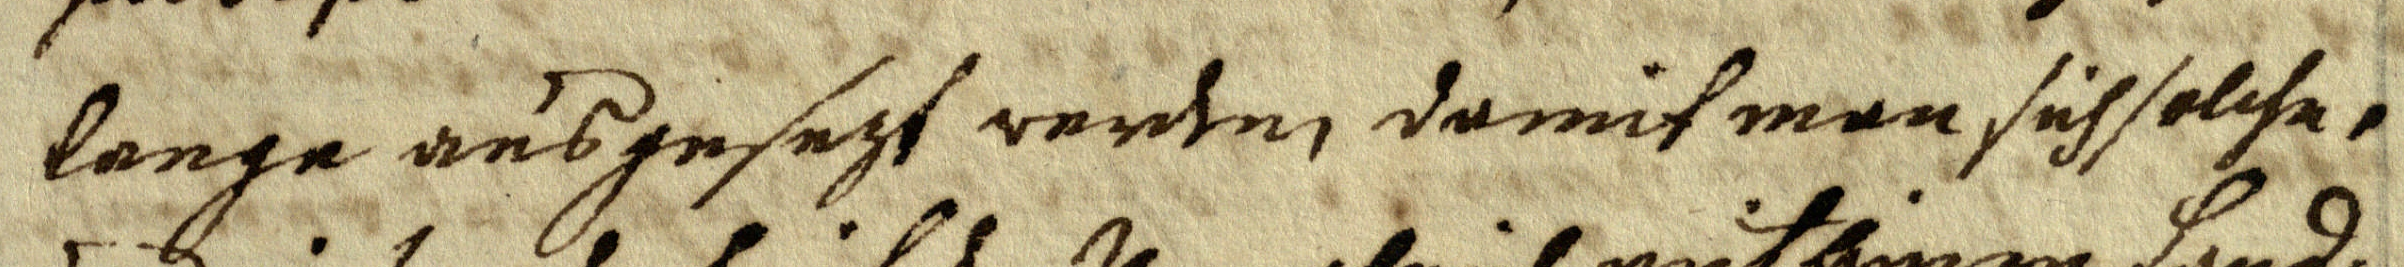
lange ausgesezt werden, damit man sich solche
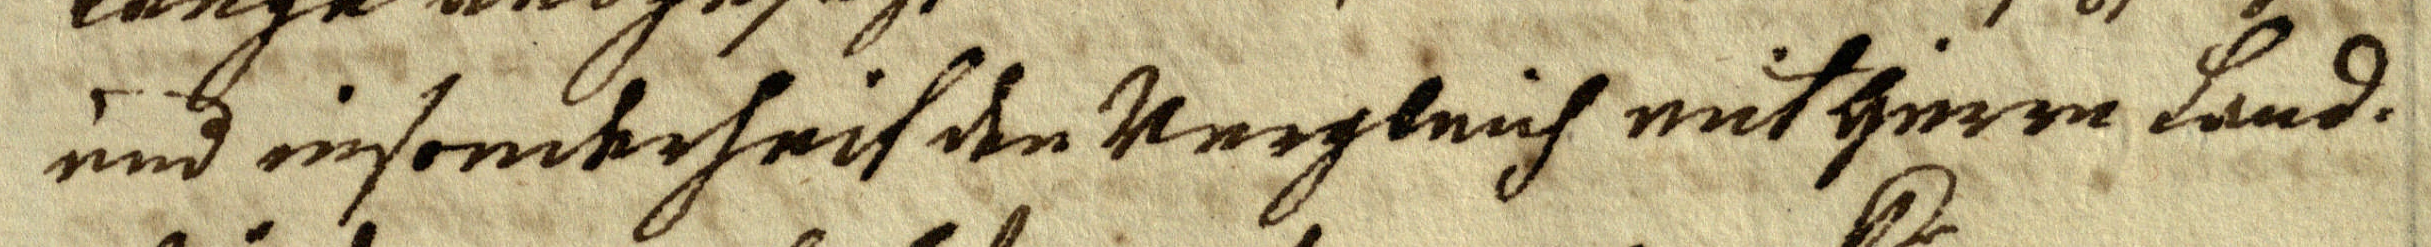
und insonderheit den Vergleich mit Herrn Land¬
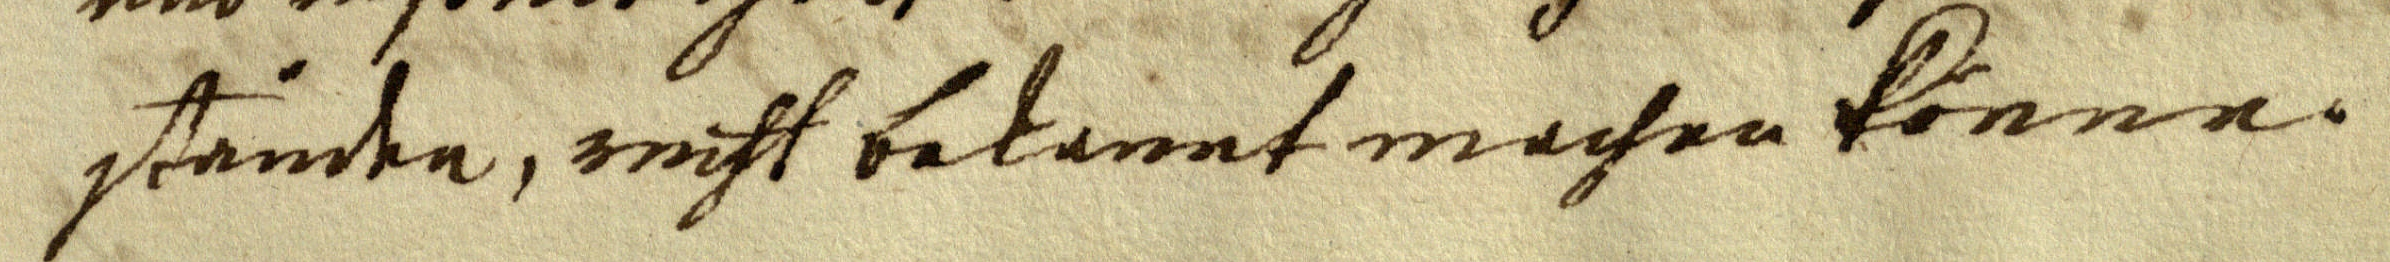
ständen, recht bekannt machen könne.
